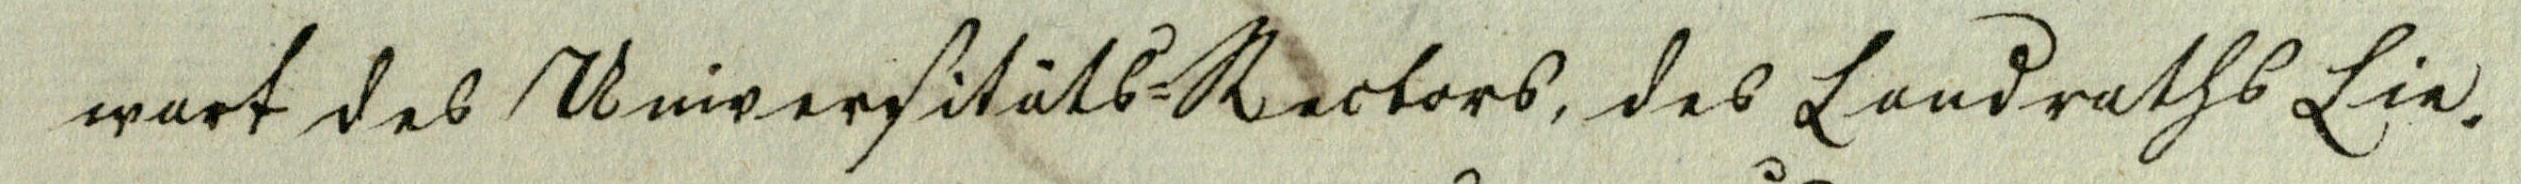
wart des Universitäts-Rectors, des Landraths Lie¬
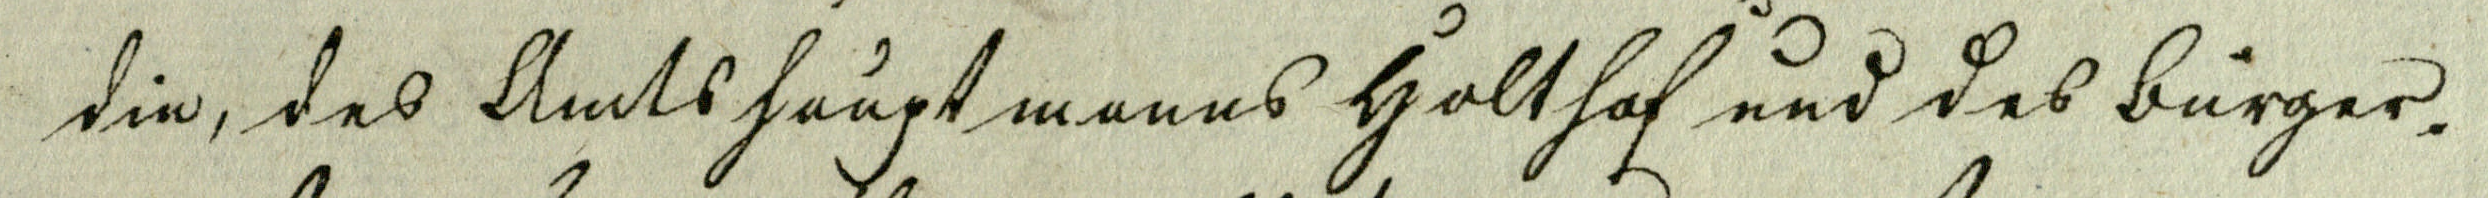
din, des Amtshauptmanns Holthof und des Bürger¬
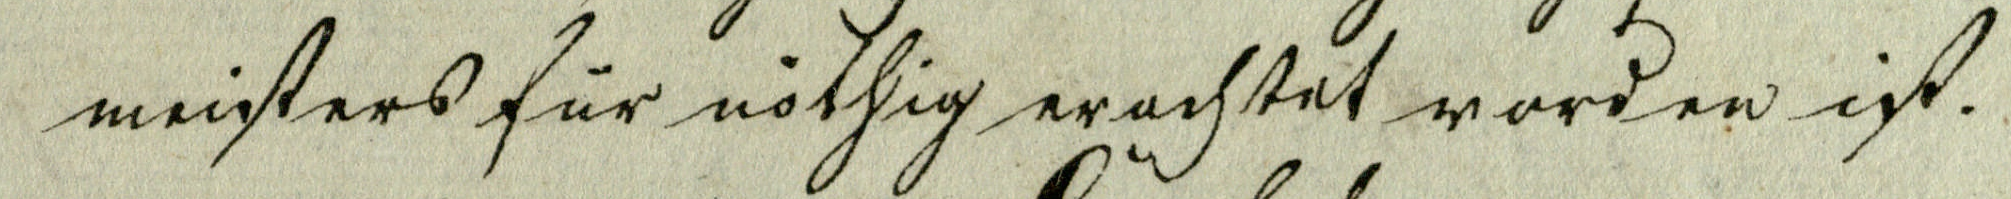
meisters für nöthig erachtet worden ist.
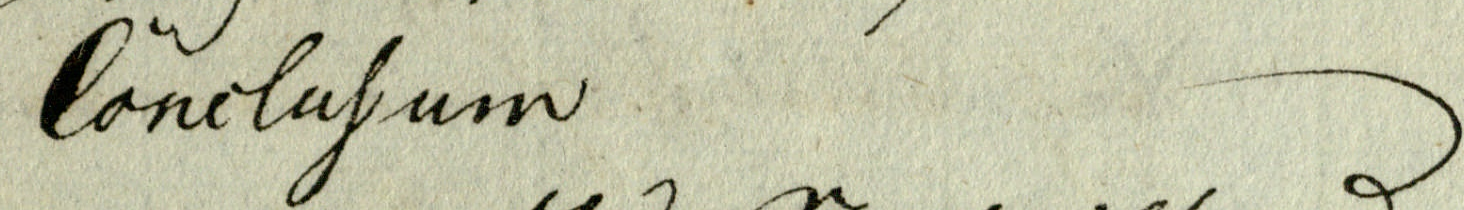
Conslusum
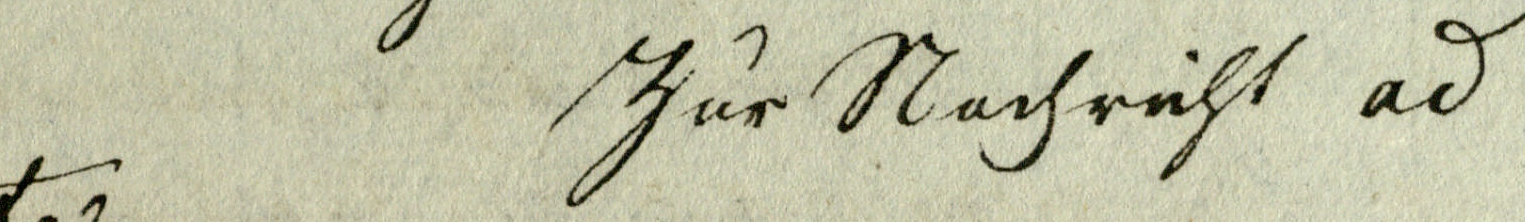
Zur Nachricht ad
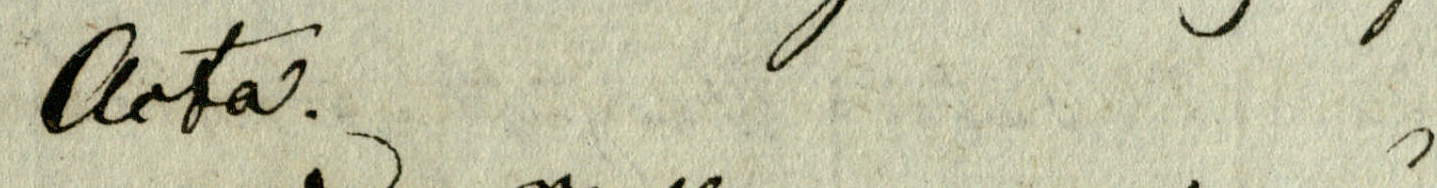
Acta.
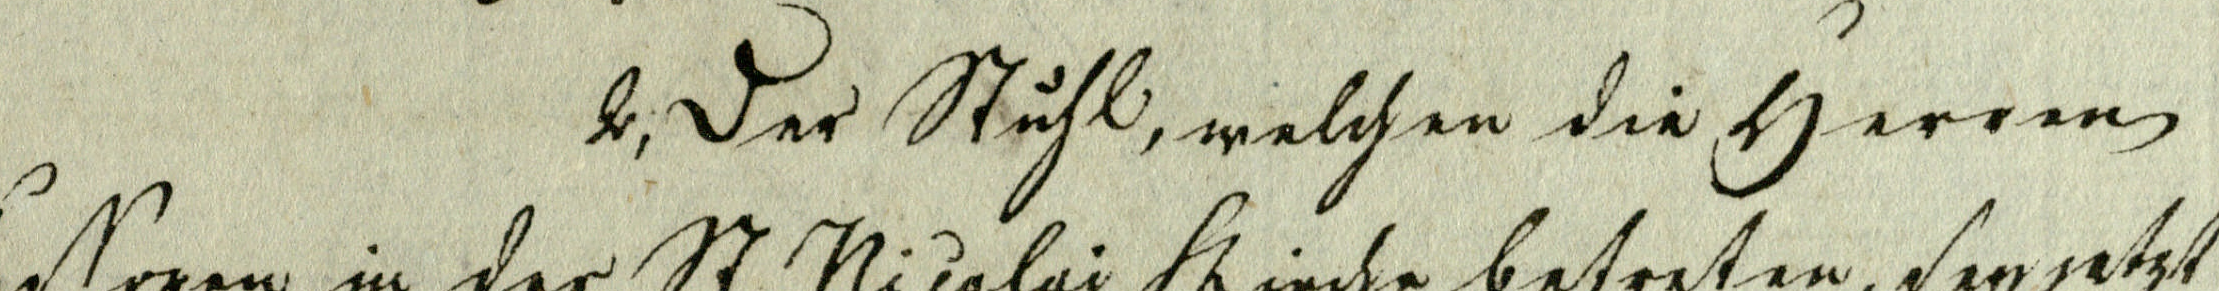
2, Der Stuhl, welchen die Herren
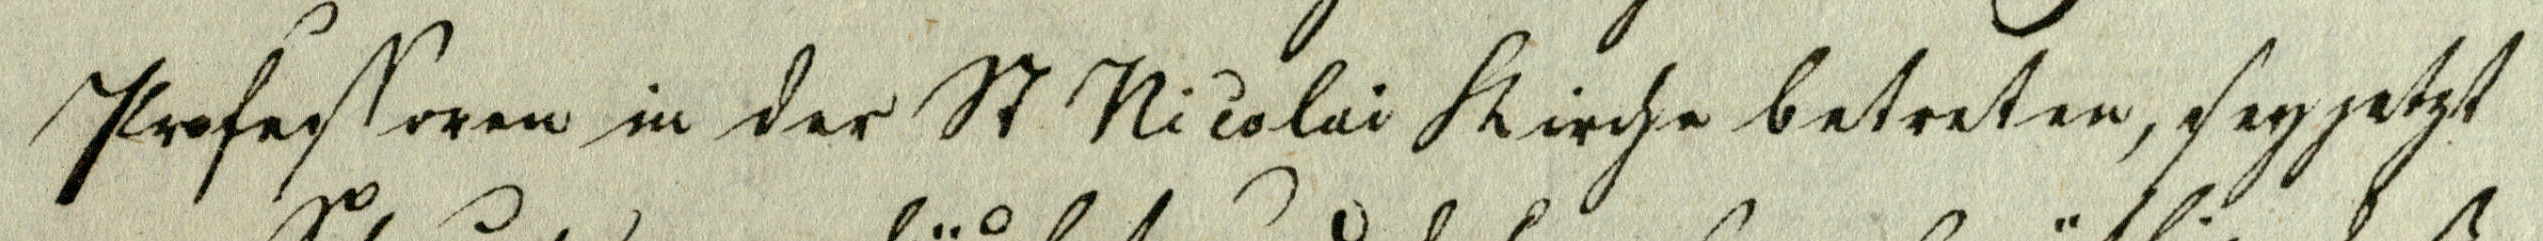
Professoren in der St Nicolai Kirche betreten, sey jetzt
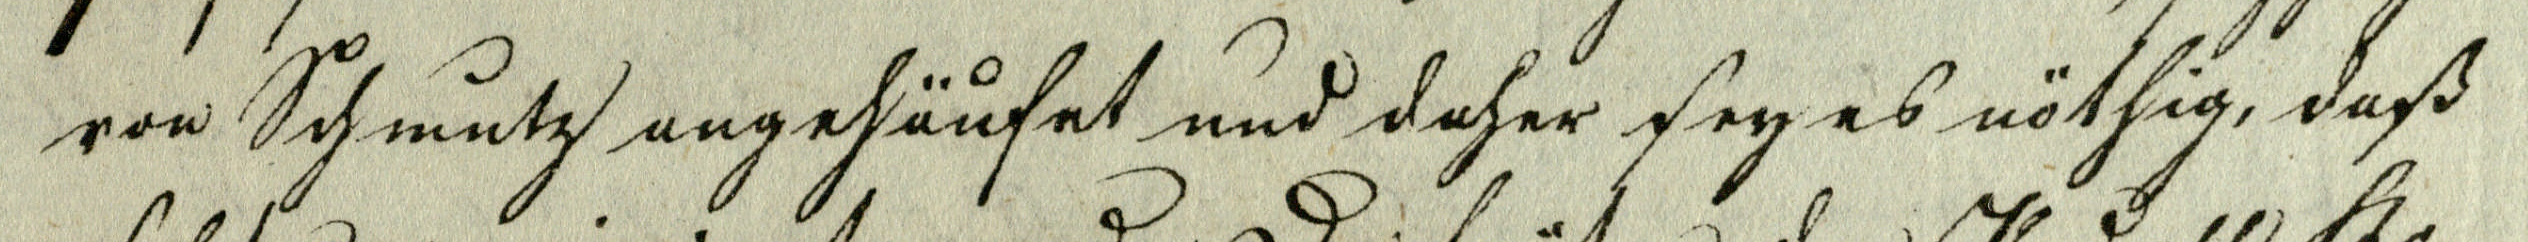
von Schmutz angehäufet und daher seyes nöthig, daß
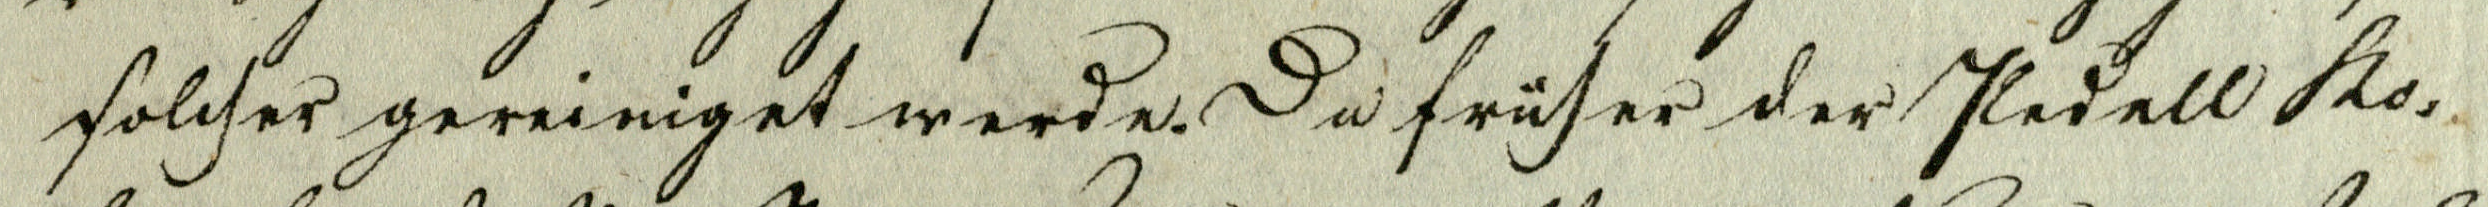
solcher gereiniget werde. Da früher der Pedell Ko¬
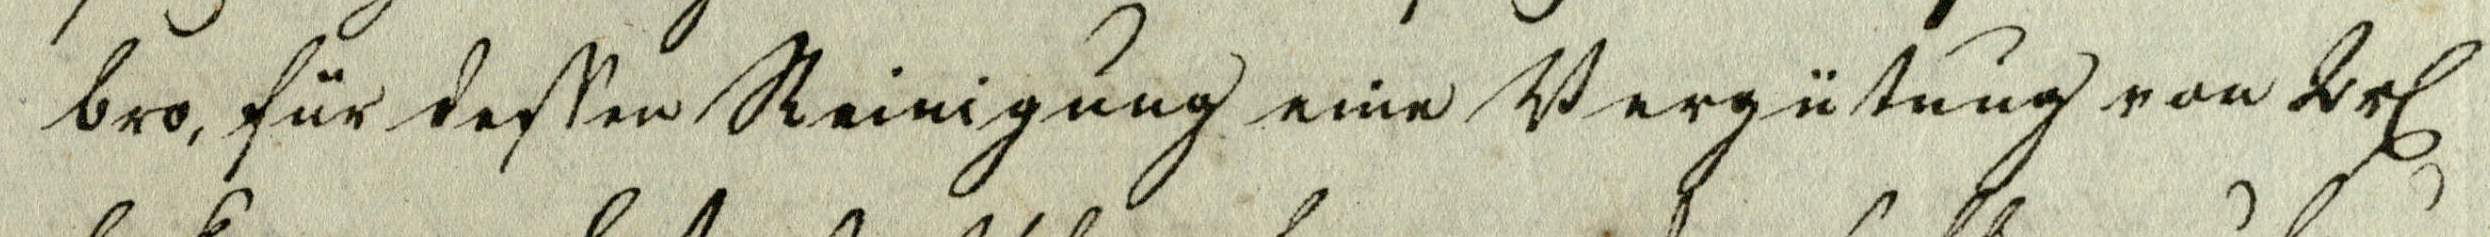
bro, für dessen Reinigung eine Vergütung von 2 r
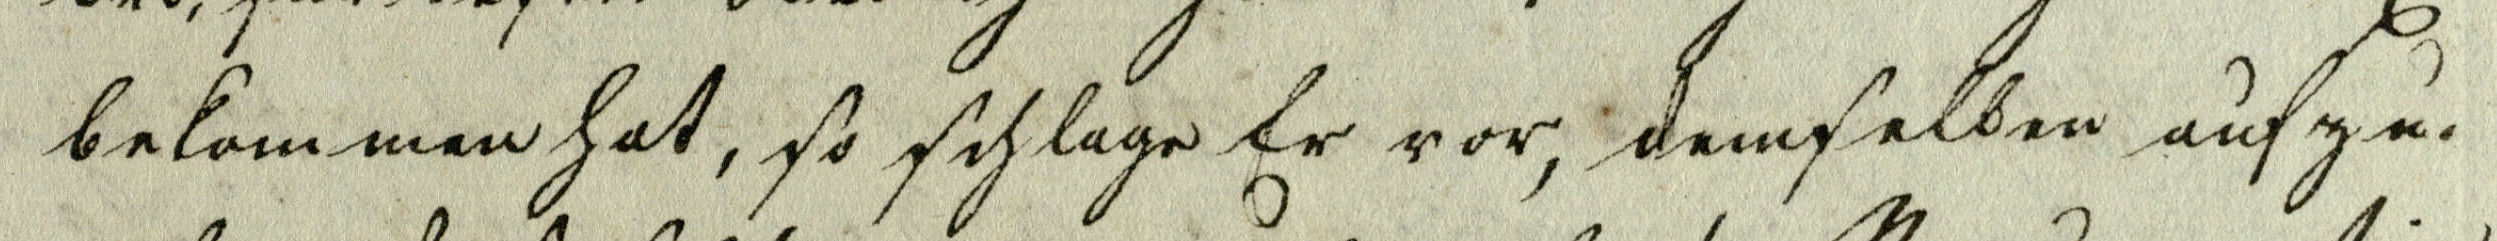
bekommen hat, so schlage Er vor, demselben aufzu¬
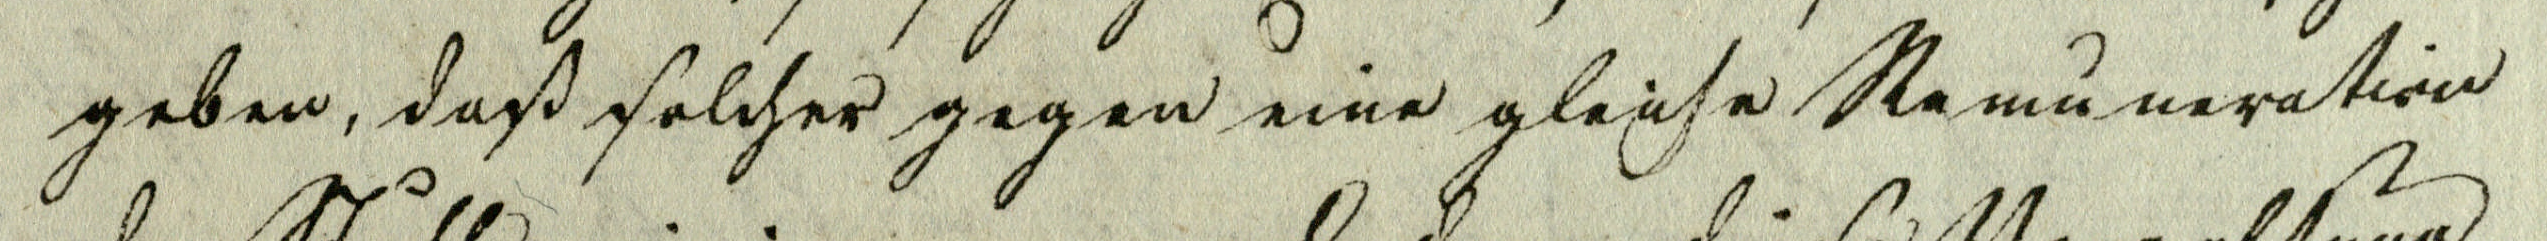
geben, daß solcher gegen eine gleiche Remuneration
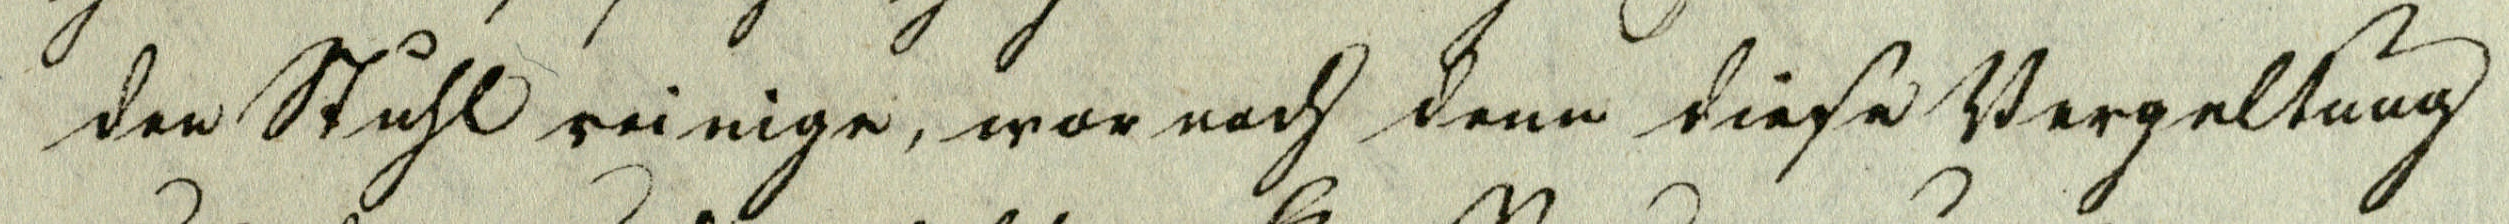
den Stuhl reinige, wor nach denn diese Vergeltung
